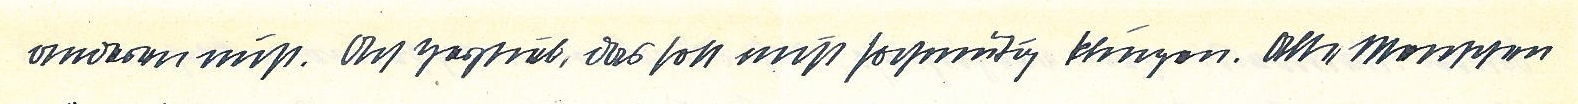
andern nicht. Ach Herzlieb, das soll nicht hochmütig klingen. Alle Menschen
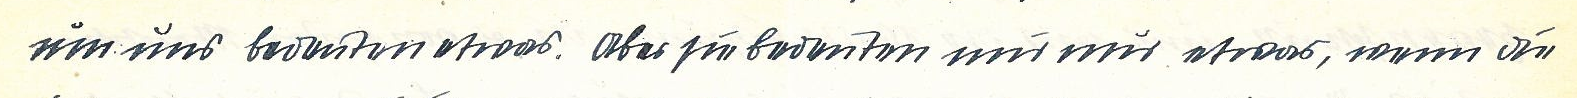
um uns bedeuten etwas. Aber sie bedeuten mir nur etwas, wenn die
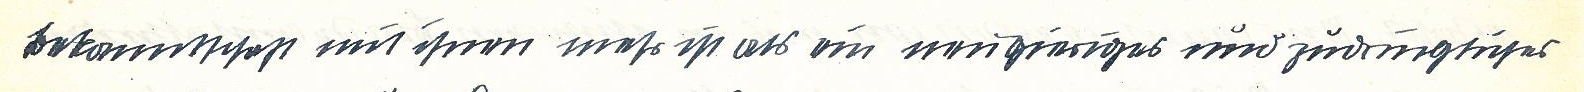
Bekanntschaft mit ihnen mehr ist als ein neugieriges und zudringliches
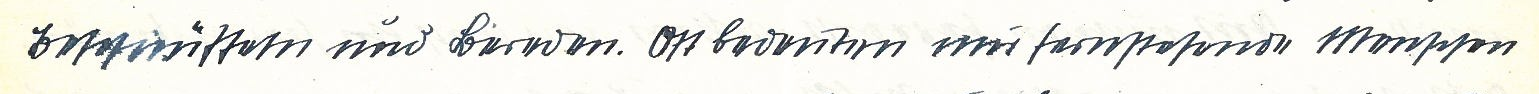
Beschnüffeln und Bereden. Oft bedeuten mir fernstehende Menschen
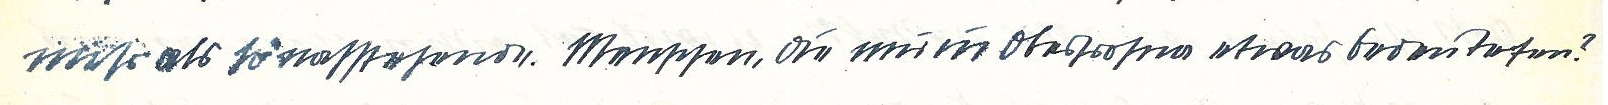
mehr als so nahstehende Menschen, die mir in O. etwas bedeuteten?
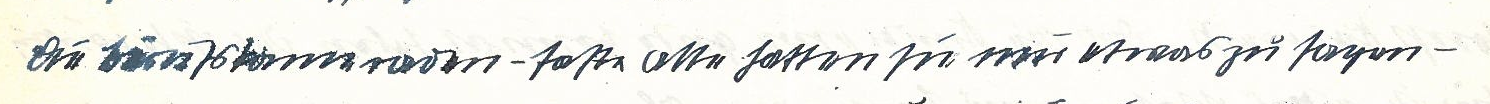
Die Berufskameraden – fast alle hatten sie mir etwas zu sagen –
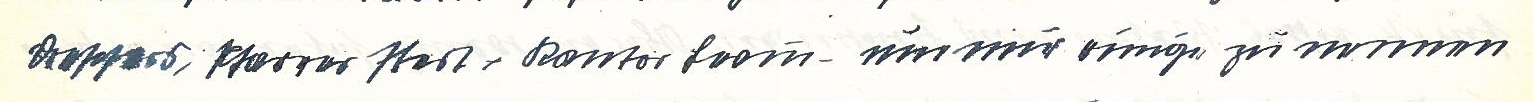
D., Pfarrer E., Kantor L. – um nur einige zu nennen
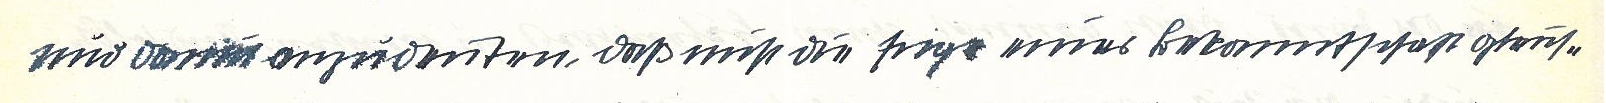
und damit anzudeuten, daß nicht die Enge einer Bekanntschaft gleich¬
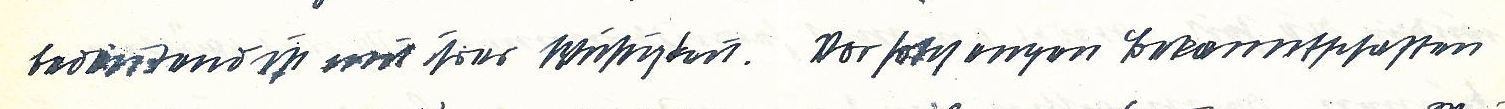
bedeutend ist mit ihrer Wichtigkeit. Vor solch engen Bekanntschaften
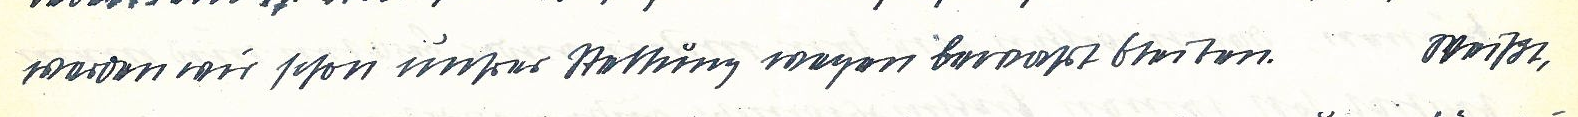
werden wir schon unsrer Stellung wegen bewahrt bleiben. Weißt
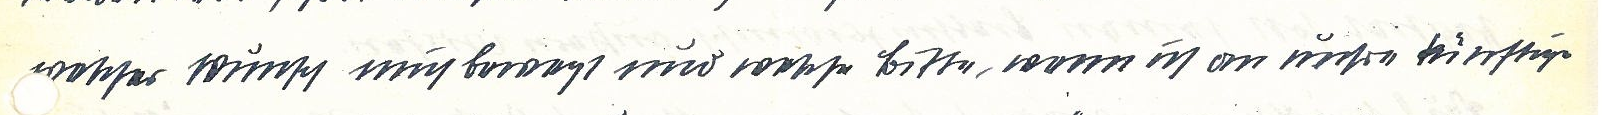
welcher Wunsch mich bewegt und welche Bitte, wenn ich an unsre künftige
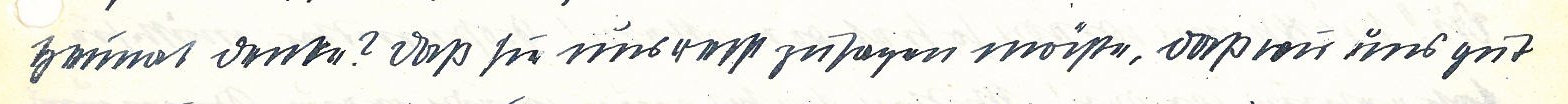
Heimat denke? Daß sie uns recht zusagen möchte, daß wir uns gut
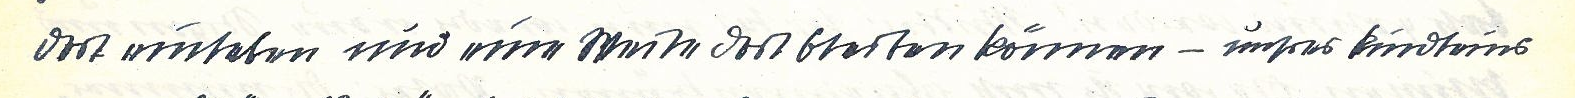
uns einleben und eine Weile dort bleiben können – unsres Kindleins
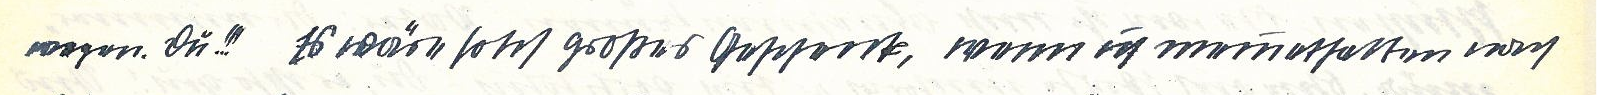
wegen. Du!!! Es wäre solch großes Geschenk, wenn ich meinethalben nach
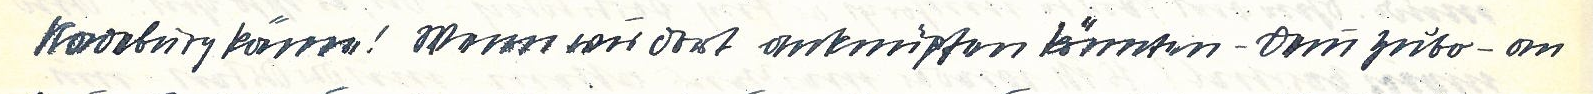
R. könnte! Wenn wir dort anknüpfen könnten – Dein Hubo – an
